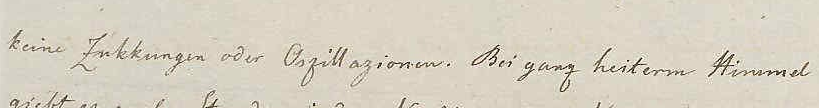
keine Zukkungen oder Oszillazionen. Bei ganz heiterm Himmel
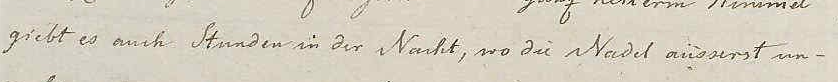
giebt es auch Stunden in der Nacht, wo die Nadel äusserst un-
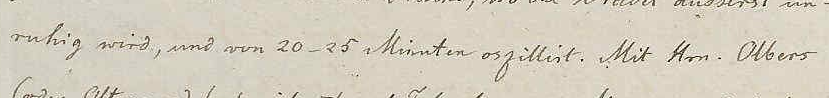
ruhig wird, und von 20–25 Minuten oszillirt. Mit Hrn. Olbers
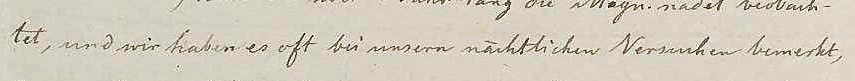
tet, und wir haben es oft bei unsern nächtlichen Versuchen bemerkt,
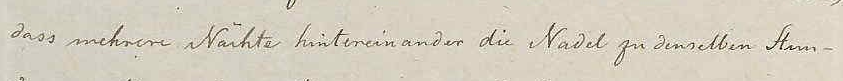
dass mehrere Nächte hintereinander die Nadel zu denselben Stun-
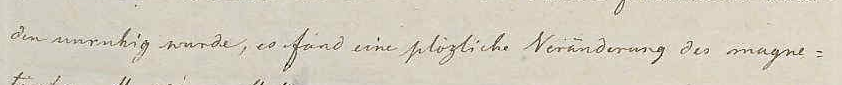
den unruhig wurde, es fand eine plözliche Veränderung des magne-
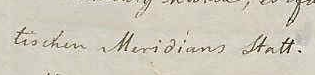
tischen Meridians Statt.
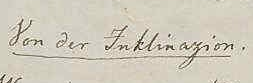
Von der Inklinazion.
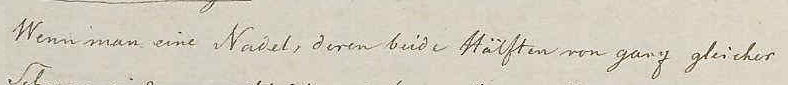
Wenn man eine Nadel, deren beide Hälften von ganz gleicher
